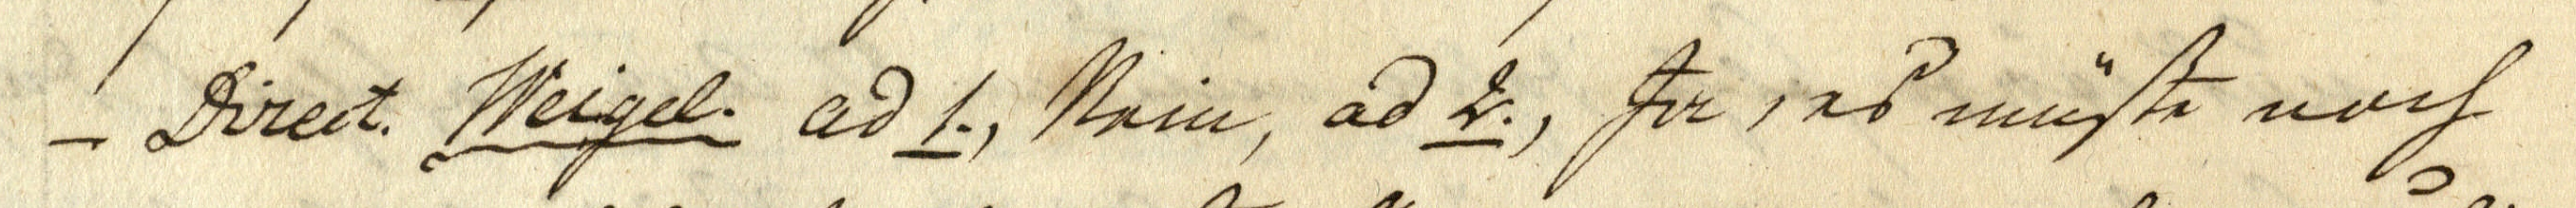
Direct. Weigel. ad 1., Nein, ad 2., Ja, es müßte noch
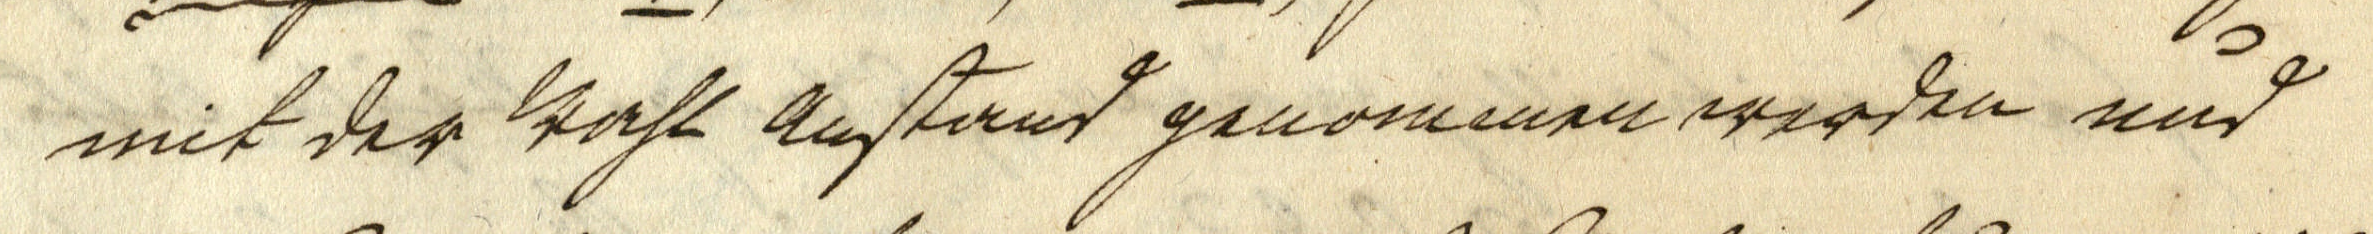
mit der Wahl Anstand genommen werden und
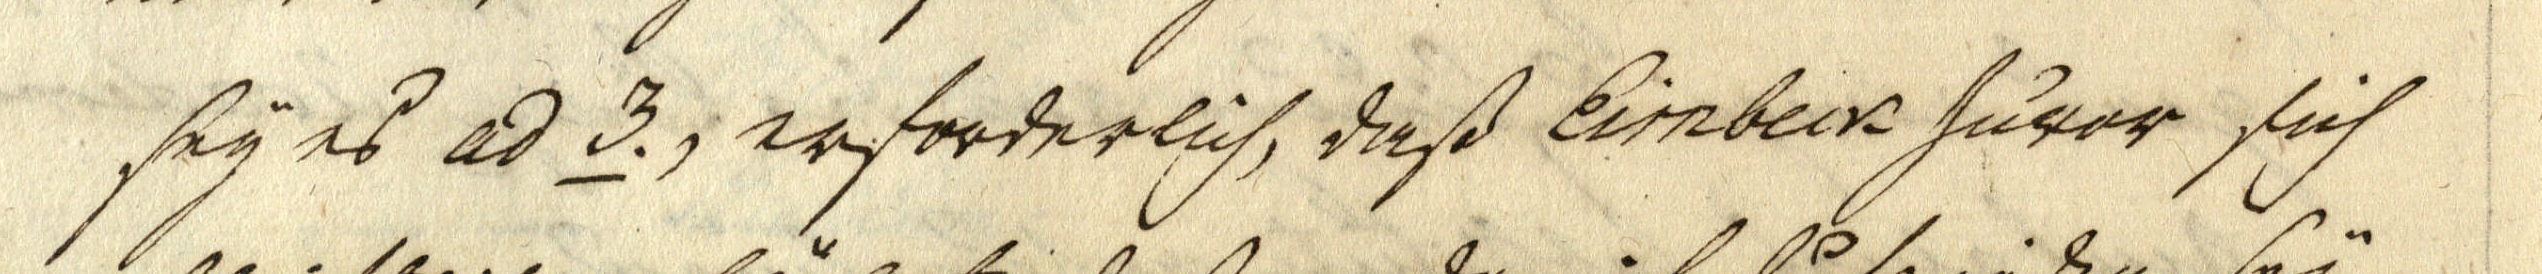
sey es ad 3., erforderlich, daß Eimbeck zuvor sich
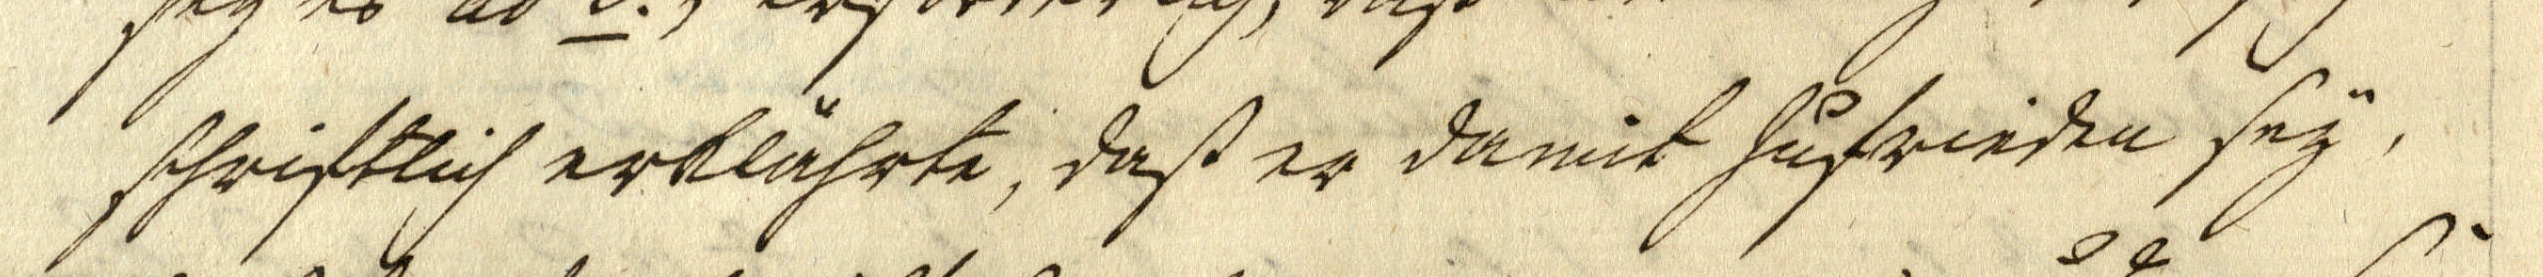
schriftlich erklährte, daß er damit zufrieden sey,
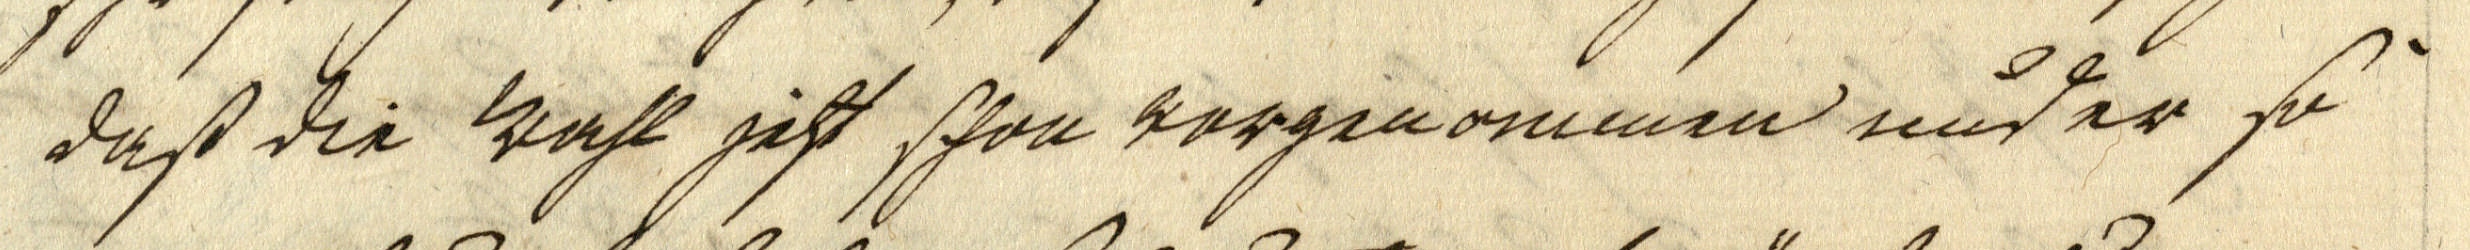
daß die Wahl jetzt schon vorgenommen und er so
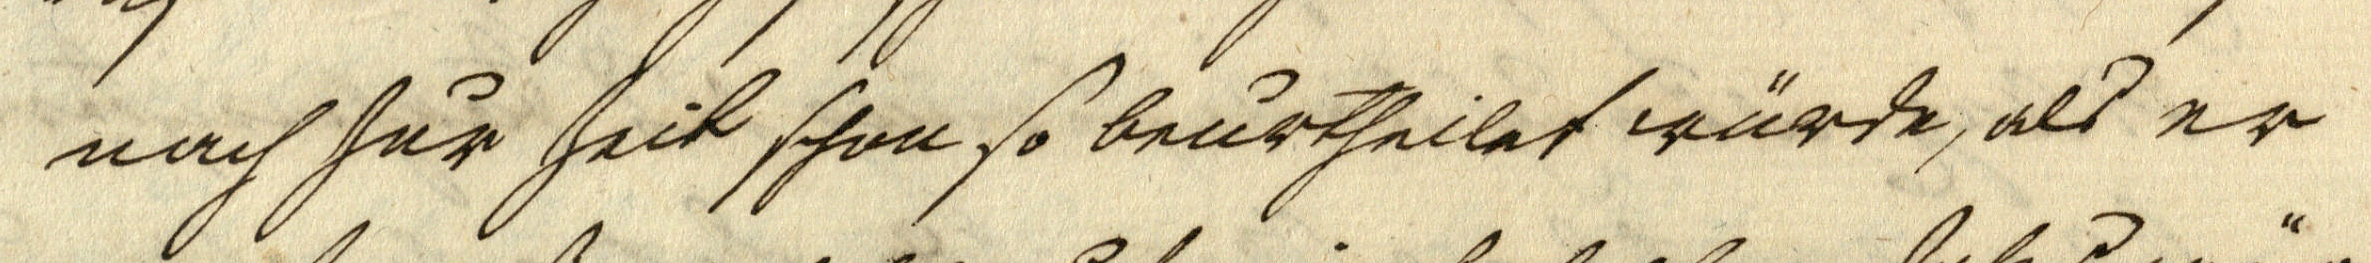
nach zur Zeit schon so beurtheilet würde, als er
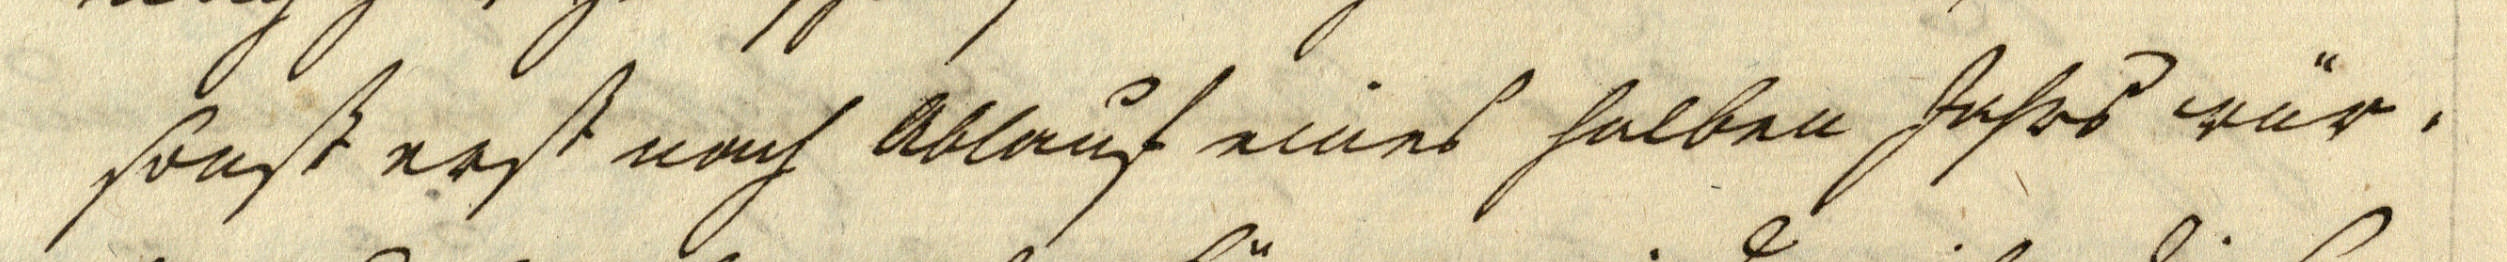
sonst erst nach Ablauf eines halben Jahres wür-
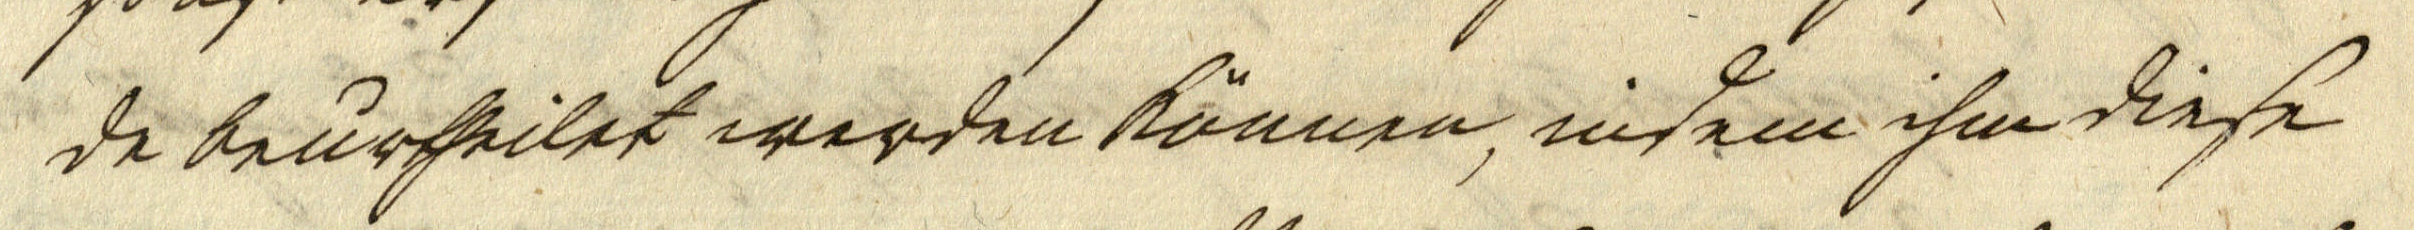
de beurtheilet werden können, indem ihm diese
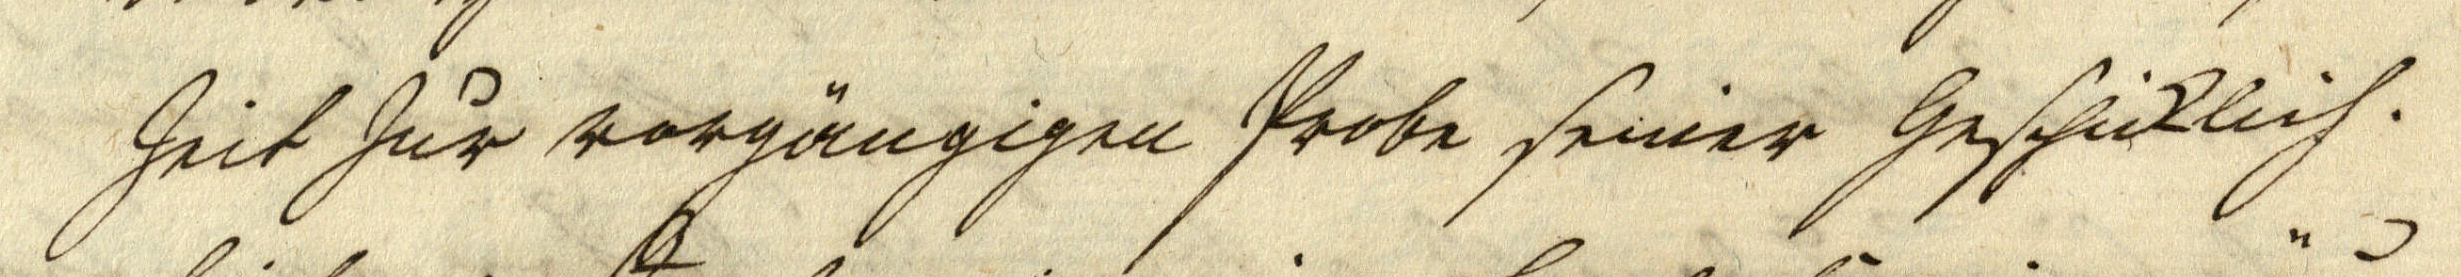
Zeit zur vorgängigen Probe seiner Geschicklich-
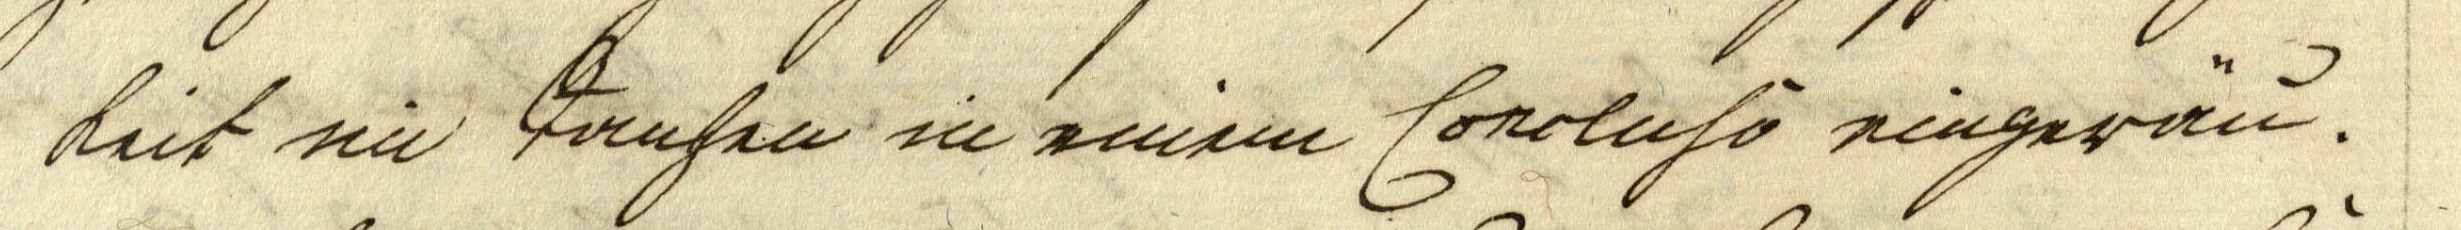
keit im Tanzen in einem Concluso eingeräu-
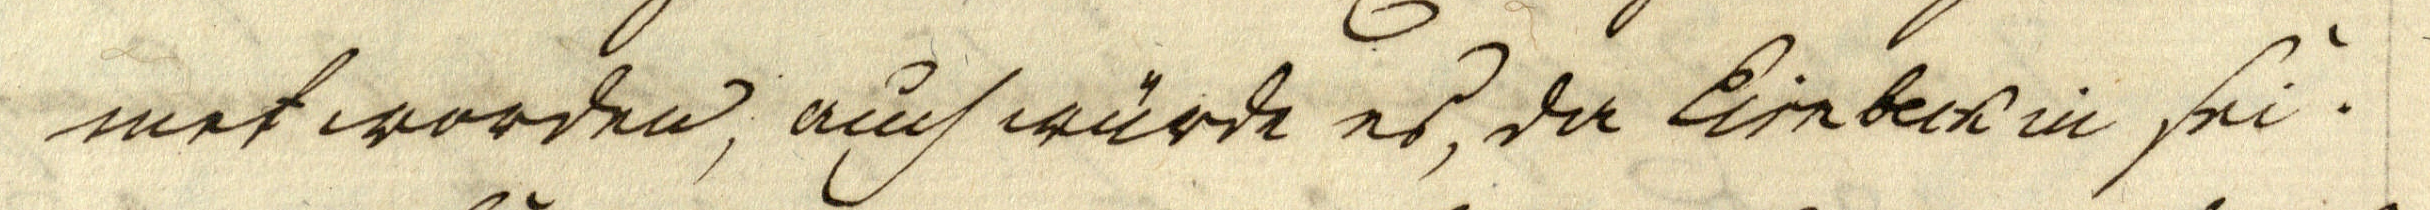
met worden, auch würde es, da Eimbeck in sei-
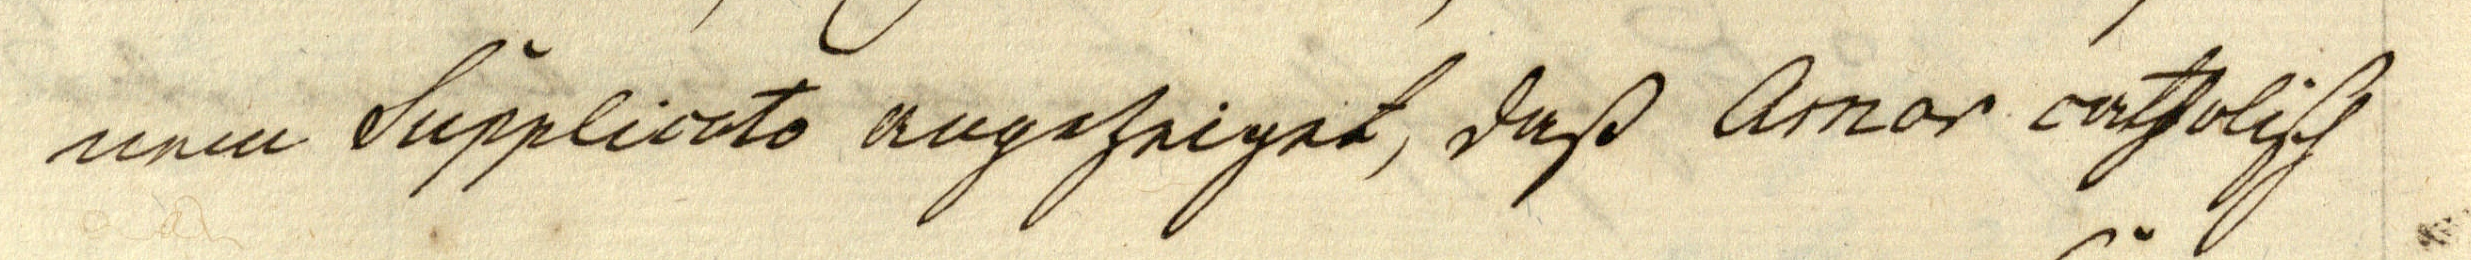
nem Supplicato angezeiget, daß Amor catholisch
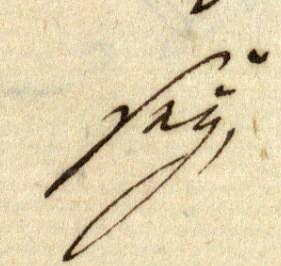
sey,
